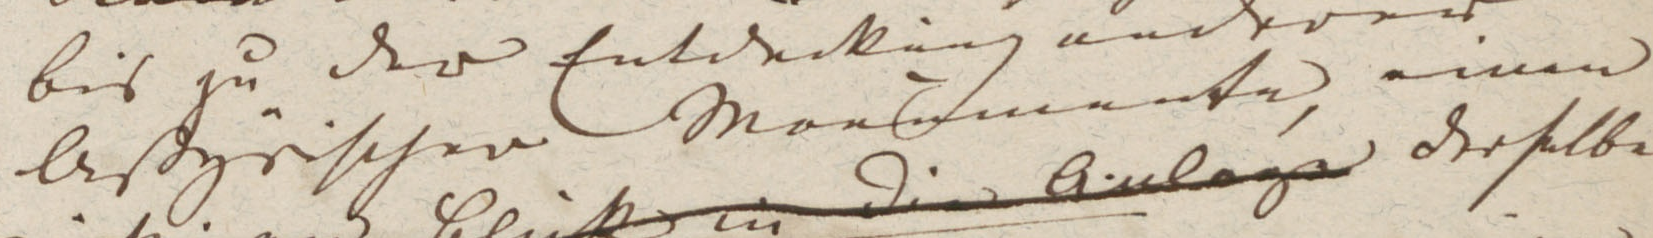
Assyrischer Monumente, einen
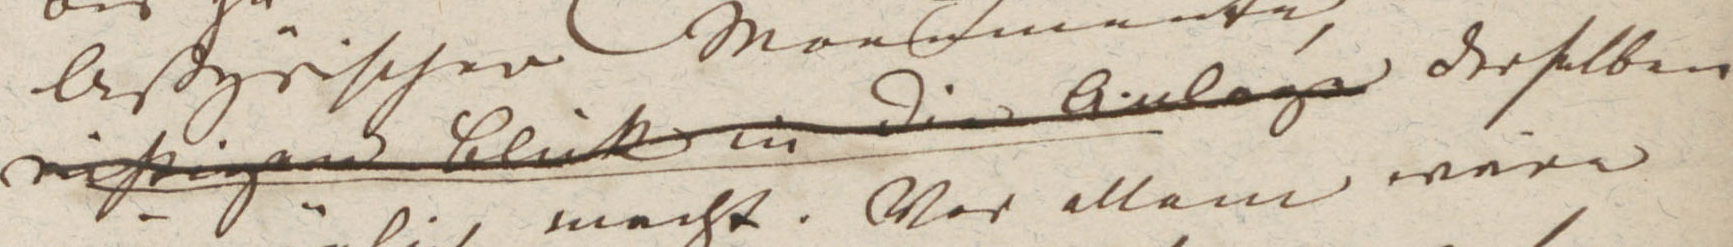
wichtigen Blick in die Anlage derselben
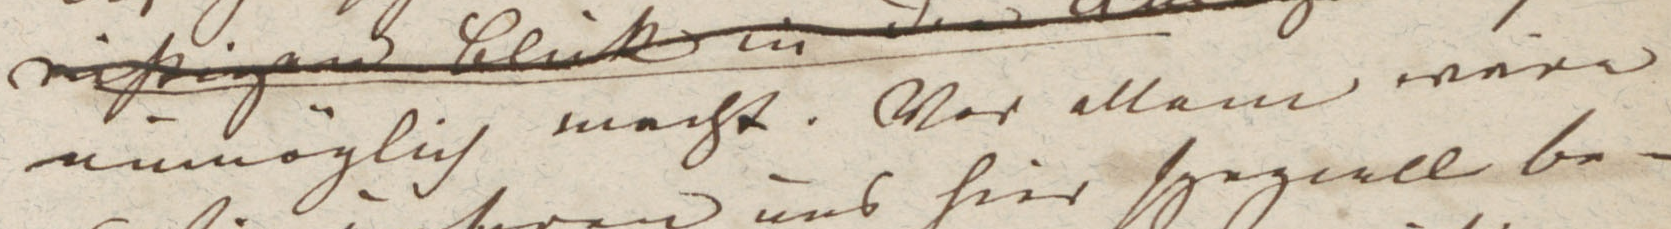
unmöglich macht. Vor allem wäre
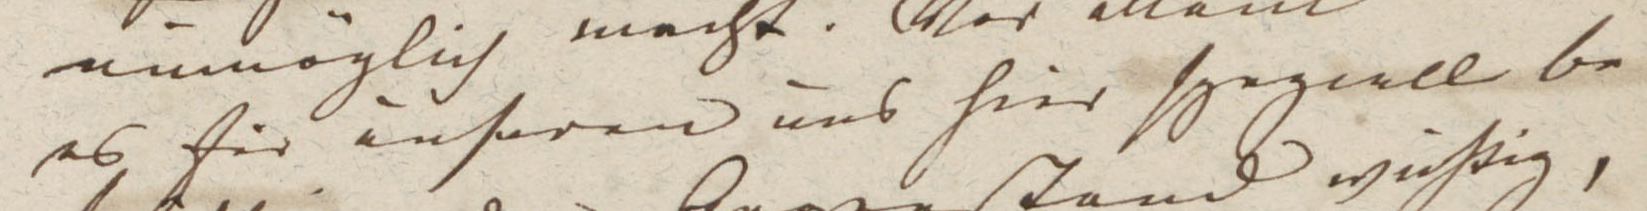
es für unseren uns hier speciell be-
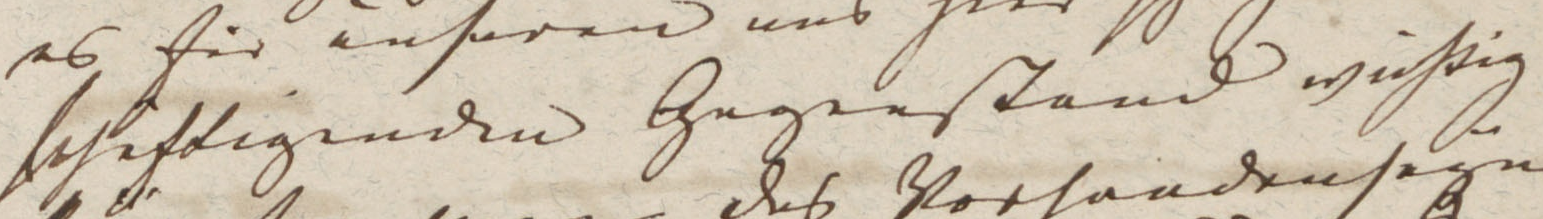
schäftigenden Gegenstand wichtig,
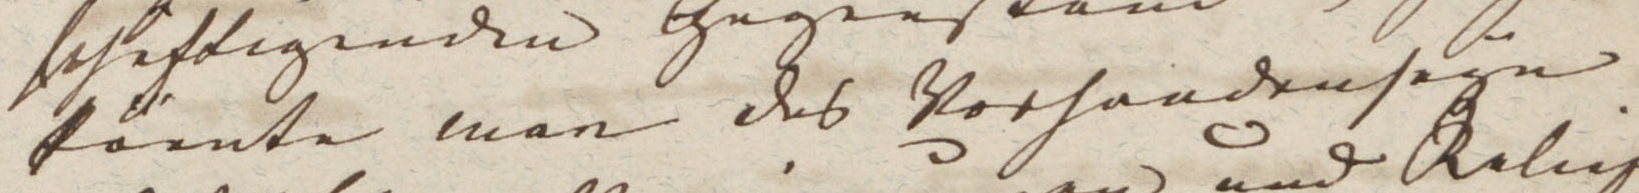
könnte man das Vorhandenseyn
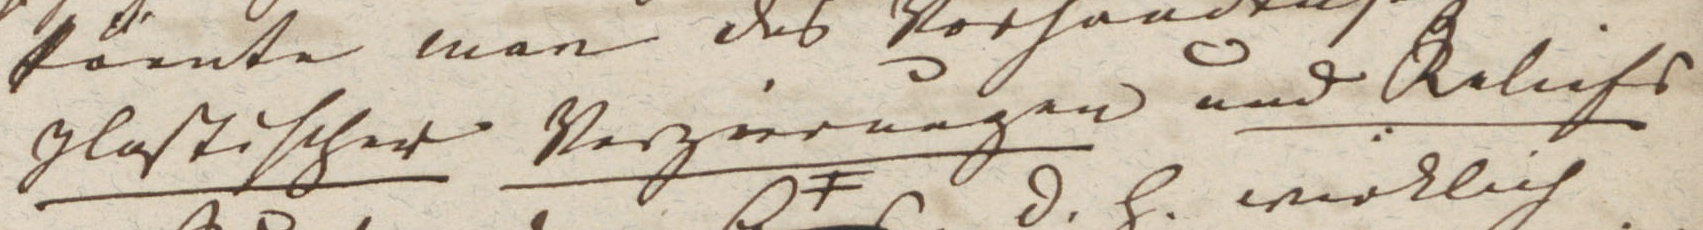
plastischer Verzierungen und Reliefs
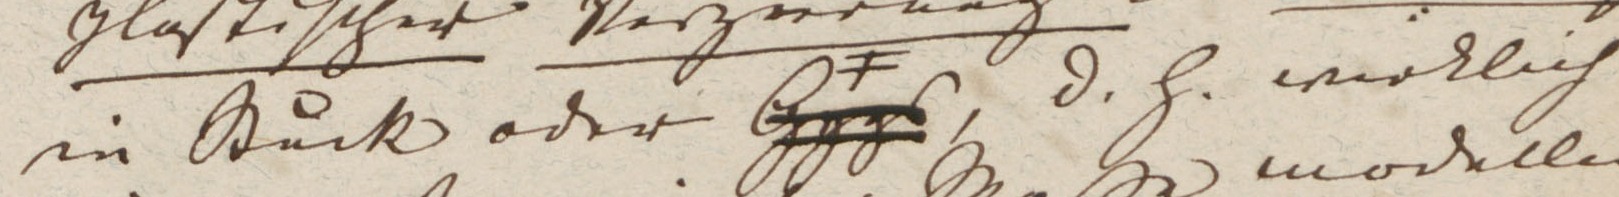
in Stuck oder Gyps%, d. h. wirklich
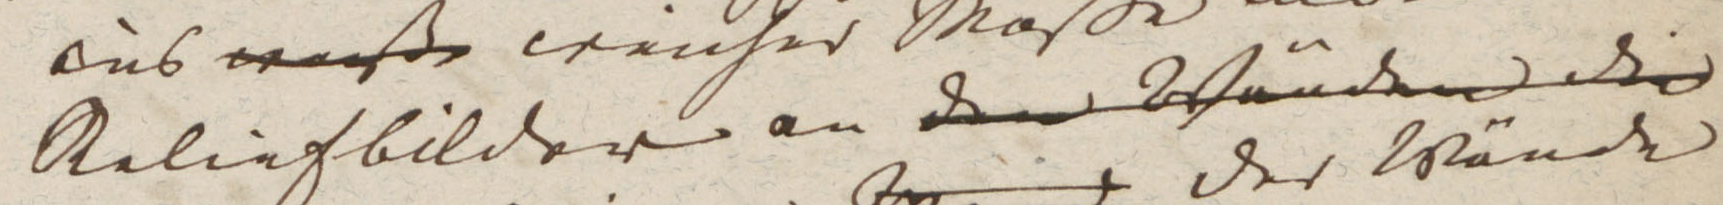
Reliefbilder an den Wänden die
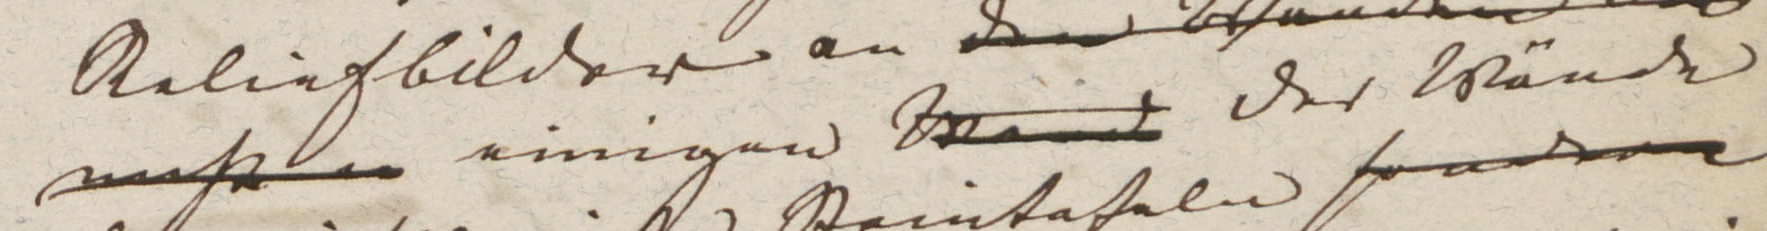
nicht einigen Wänd der Wände
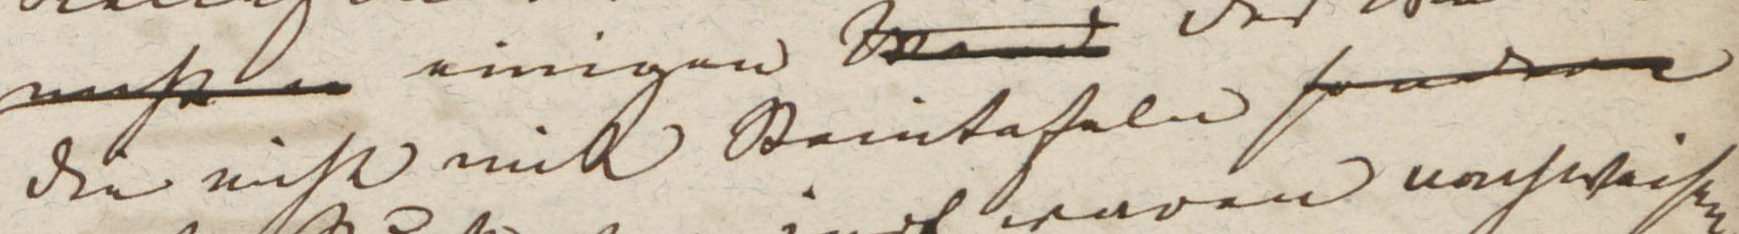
die nicht mit Steintafeln sondern
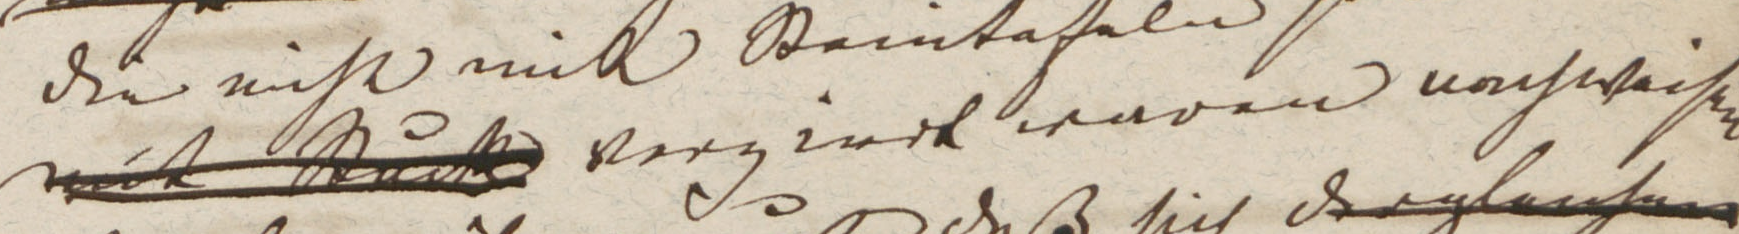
mit Stuck verziert waren nachweisen.
